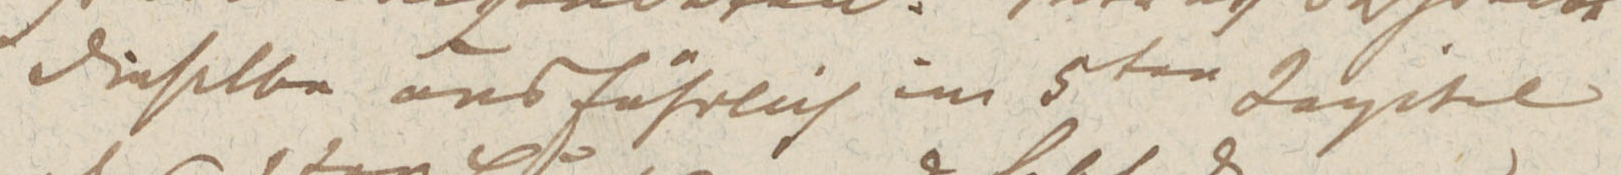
dieselbe ausführlich im 5ten Kapitel
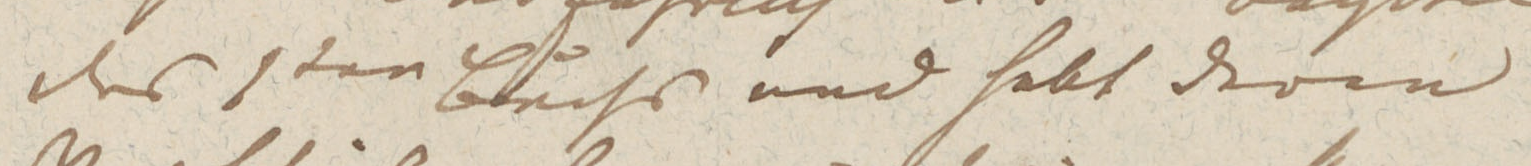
des 1ten Buchs und hebt deren
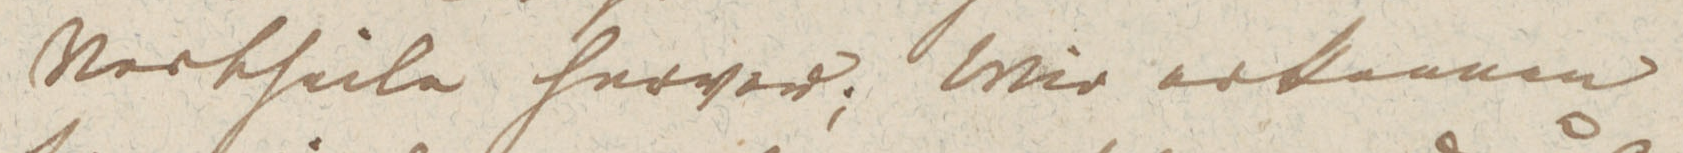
Vortheile hervor; Wir erkennen
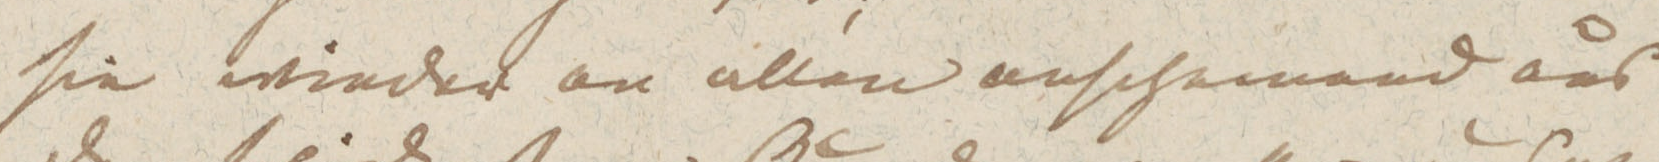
sie wieder an allen anscheinend aus
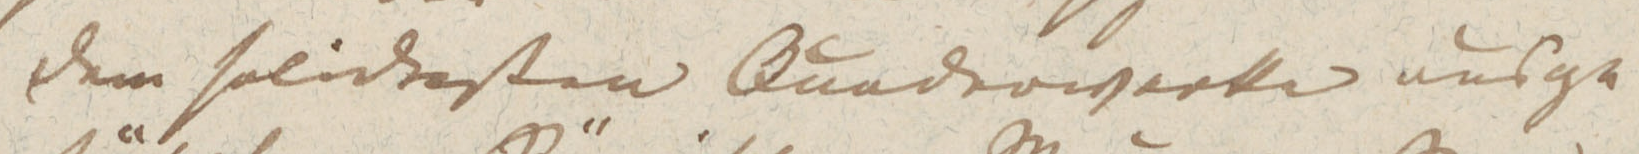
dem solidesten Quaderwerke ausge
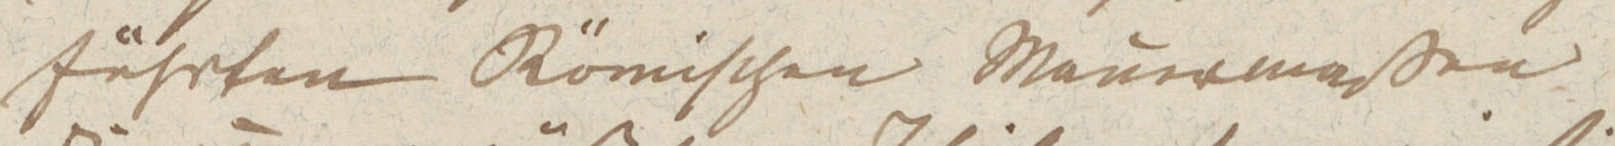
führten Römischen Mauermassen
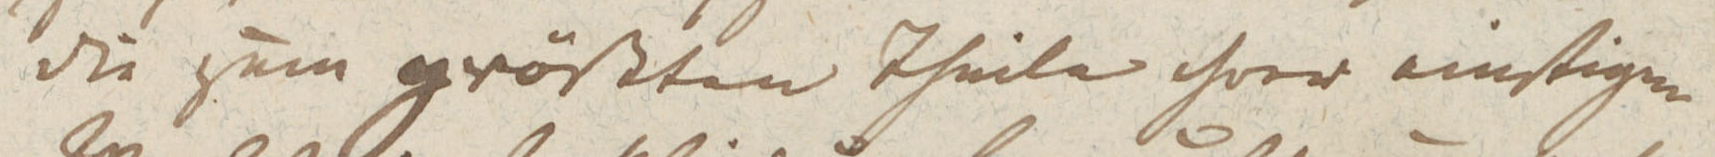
die zum grössten Theile ihrer einstigen
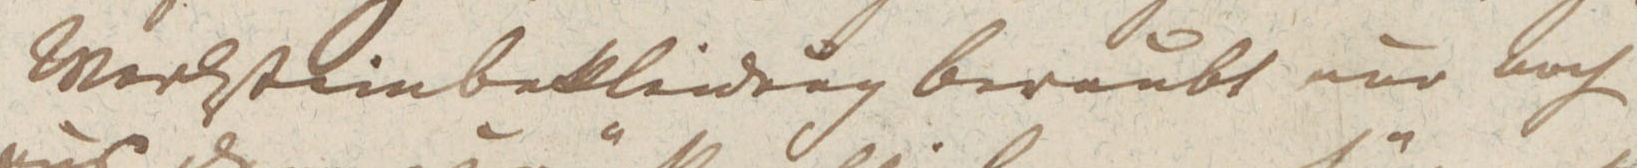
Werksteinbekleidung beraubt nur noch
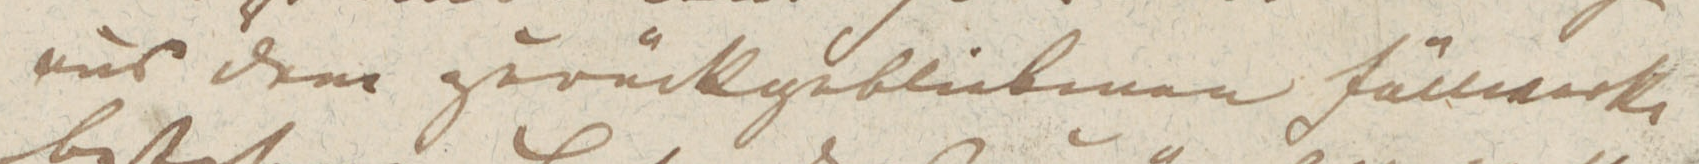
aus dem zurückgebliebenen Füllwerke
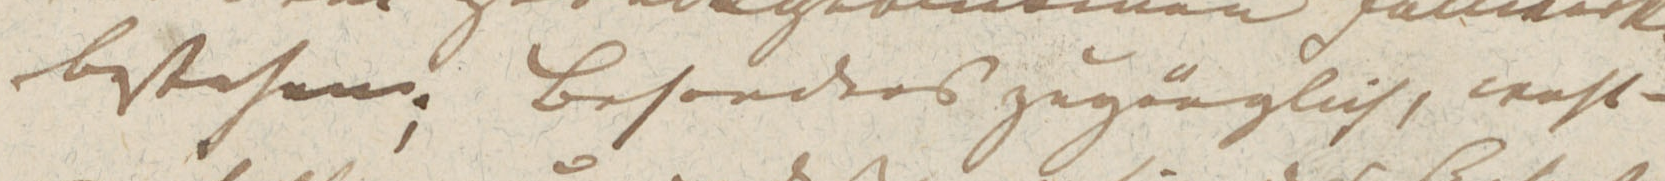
bestehen; Besonders zugänglich, wohl-
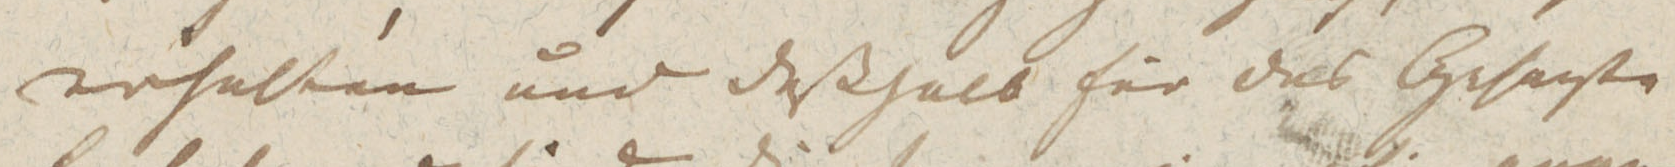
erhalten und desshalb für das Gesagte
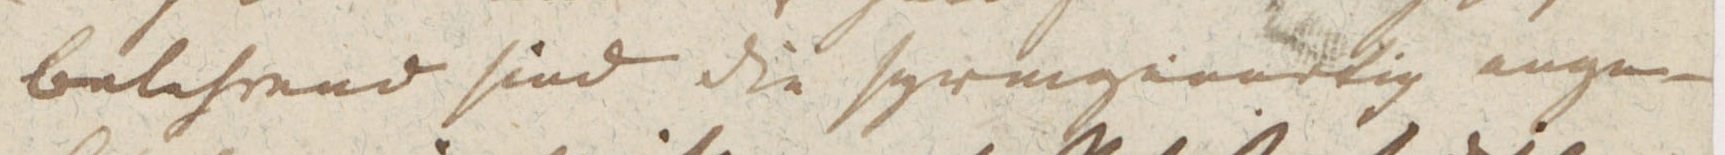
belehrend sind die syringenartig ange-
